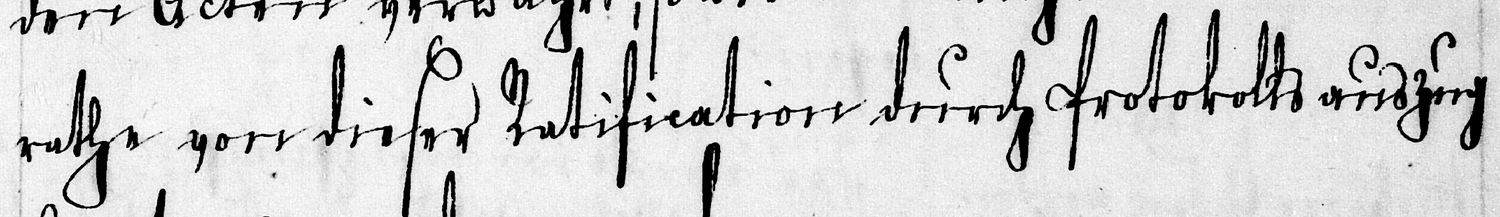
rathe von dieser Ratification durch Protokollsauszug
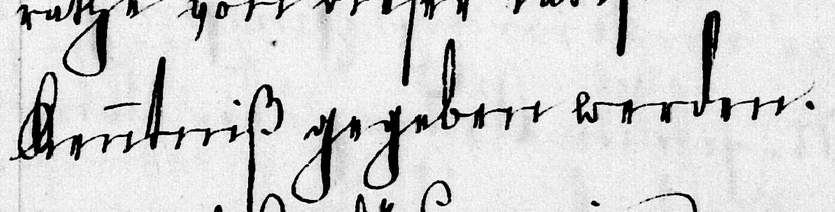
Kenntniß gegeben werden.
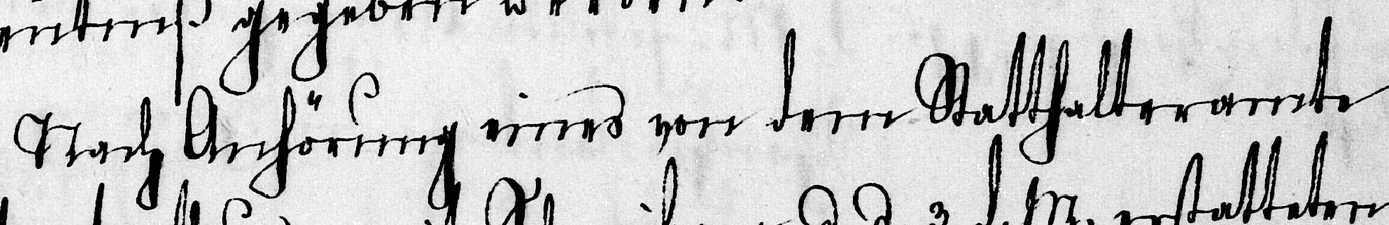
Nach Anhörung eines von dem Statthalteramte
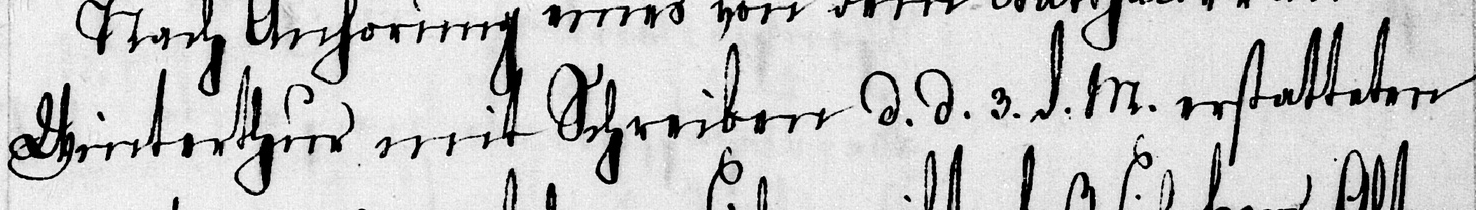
Winterthur mit Schreiben d. d. 3. d. M. erstatteten
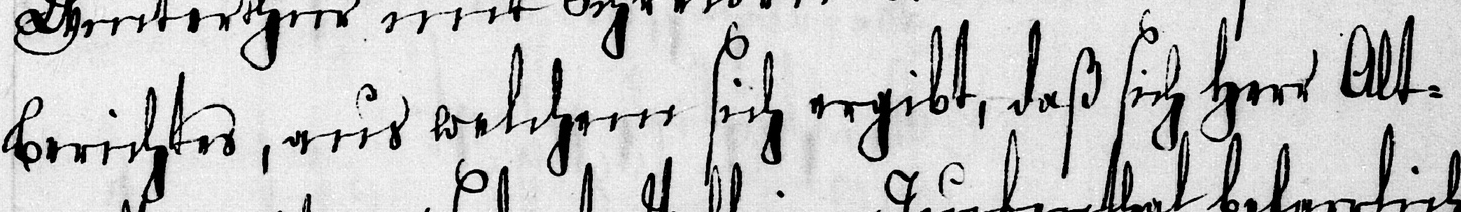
Berichtes, aus welchem sich ergibt, daß sich Herr Al¬
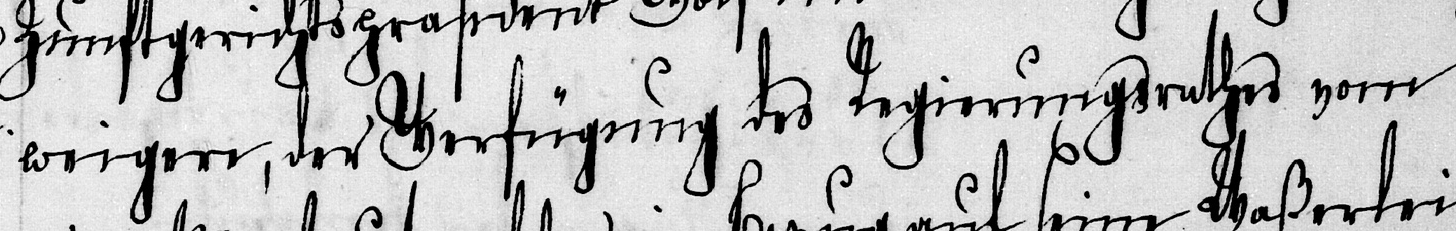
weigere, der Verfügung des Regierungsrathes vom
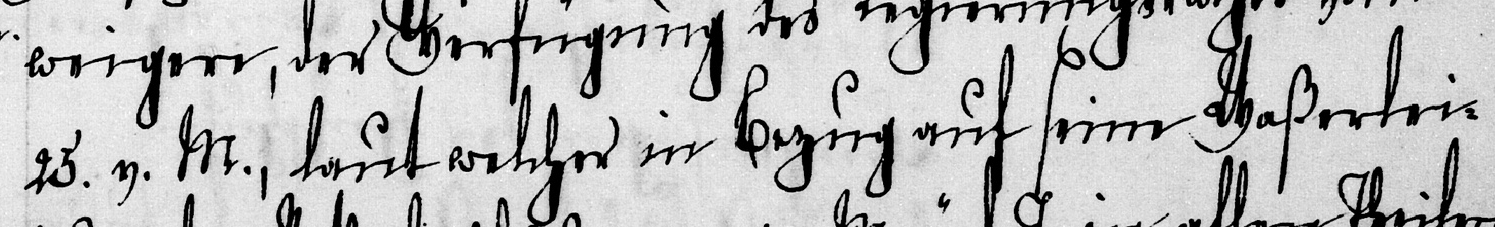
25. v. M., laut welcher in Bezug auf seine Waßerlei¬
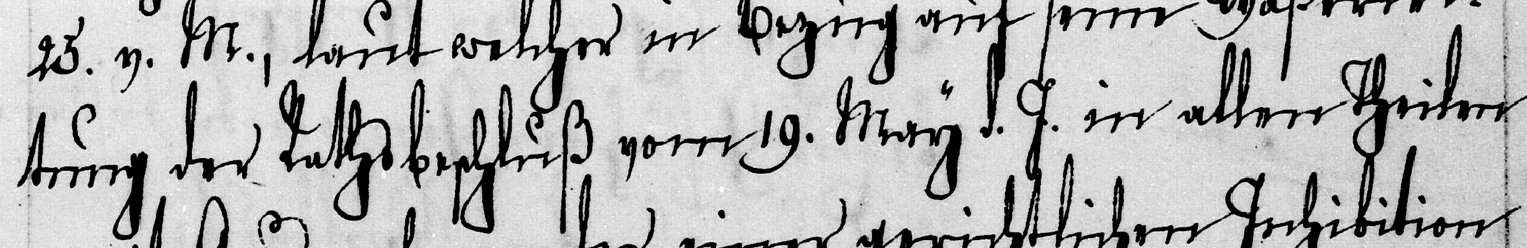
tung der Rathsbeschluß vom 19. May d. J. in allen Theilen
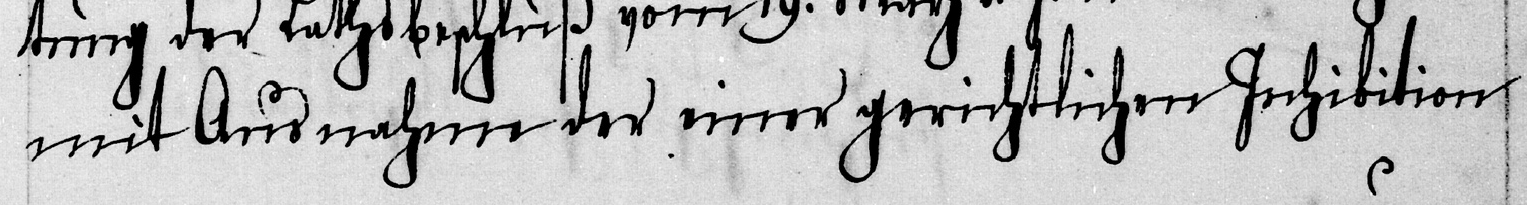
mit Ausnahme der einer gerichtlichen Inhibition
